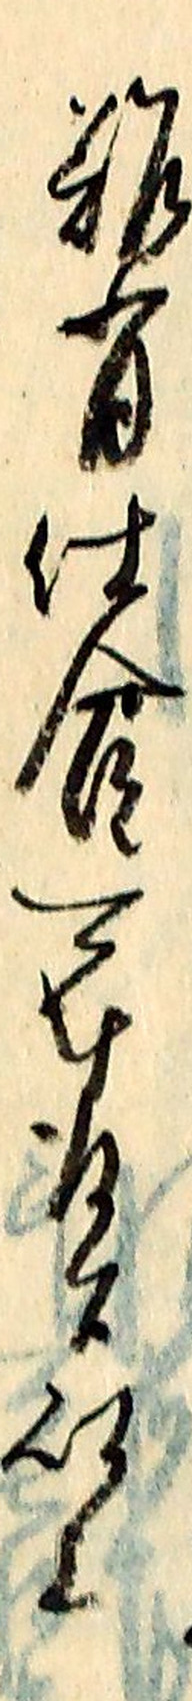難有仕合に可奉存候以上
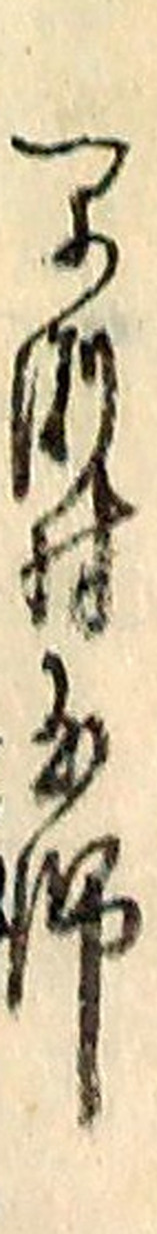早淵村玉師
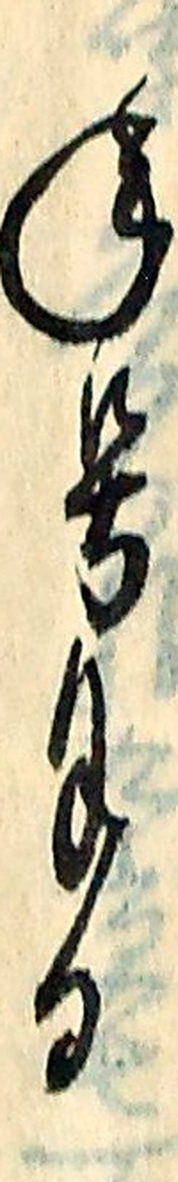年号月日
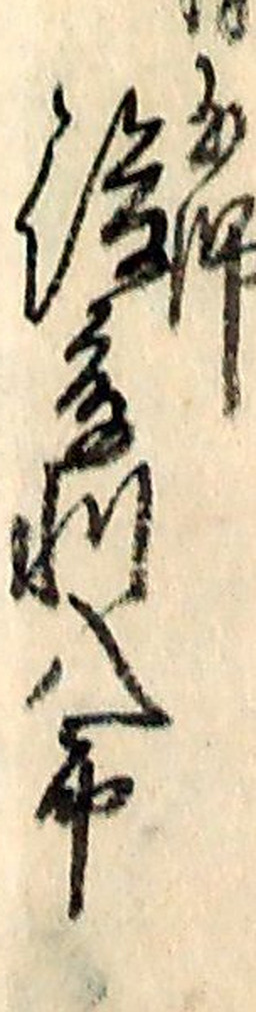後藤利八郎
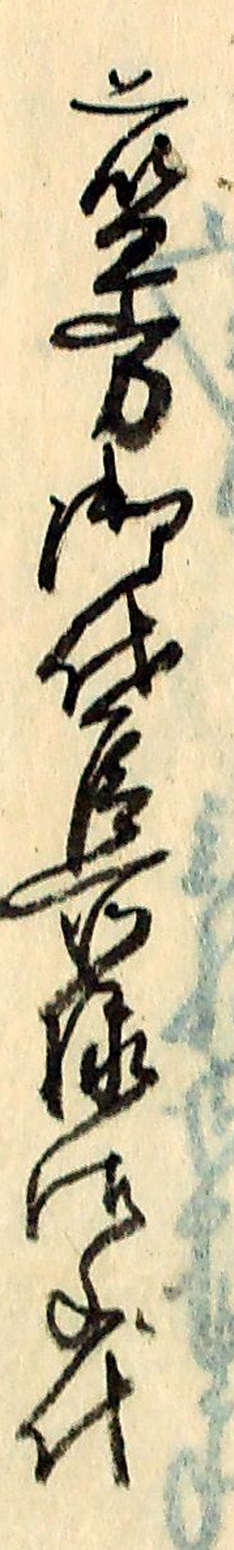藍方御代官所様御手代
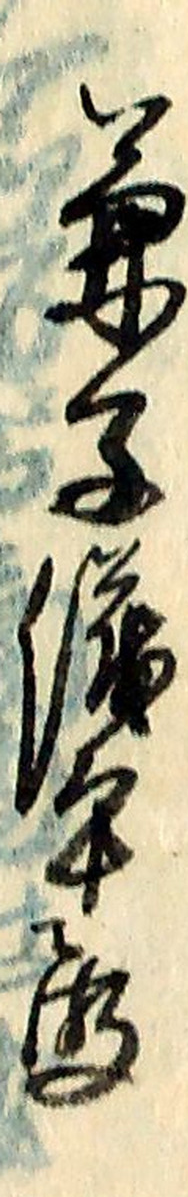兼子儀平殿
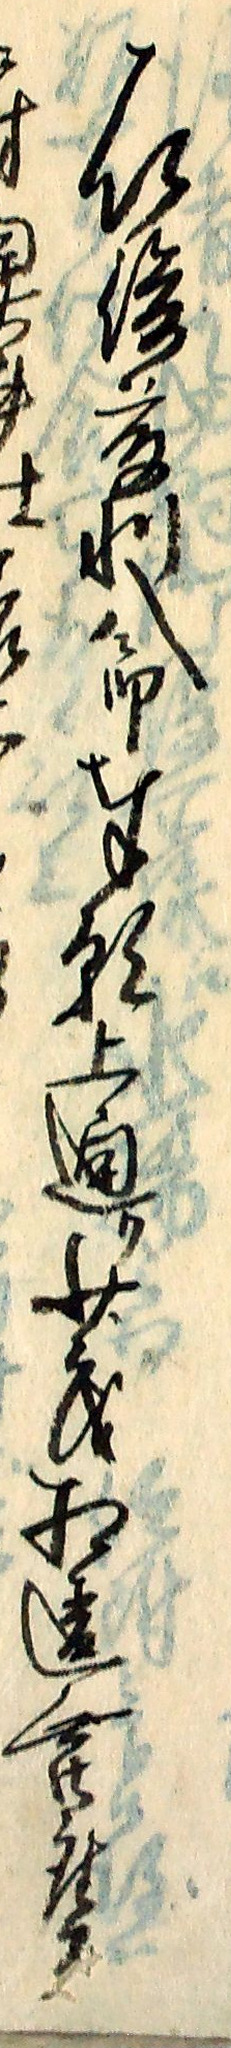右後藤利八郎奉願上通り少も相違無御座候
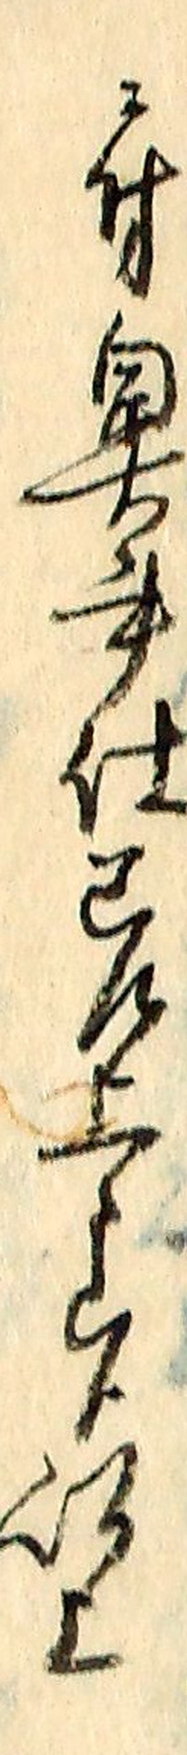に付奥書仕差上申上候以上
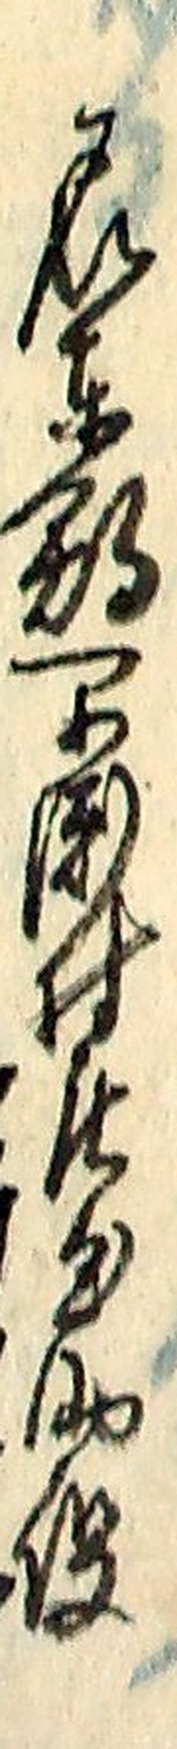名東郡早淵村庄屋助役
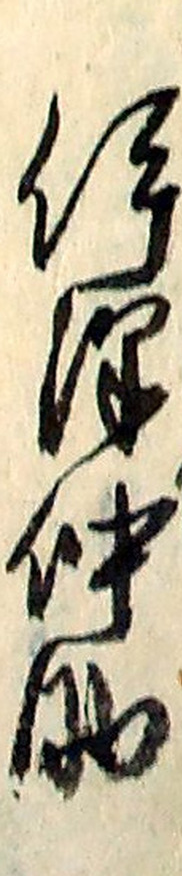伊沢仲助
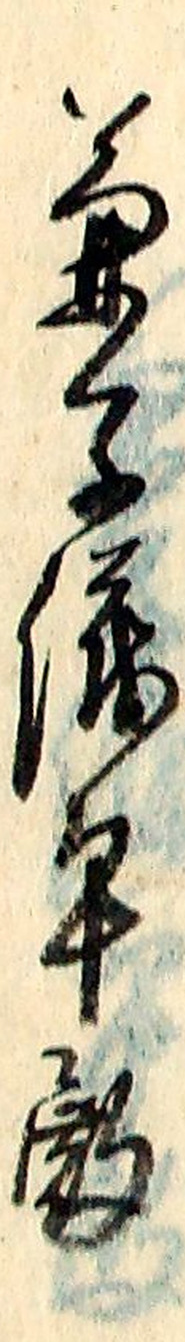兼子儀平殿

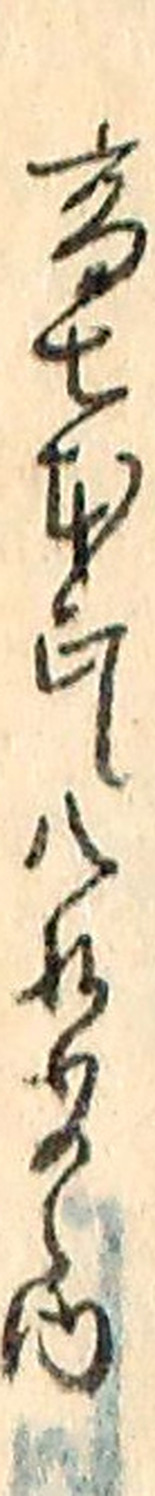高七本正八拾貫之内
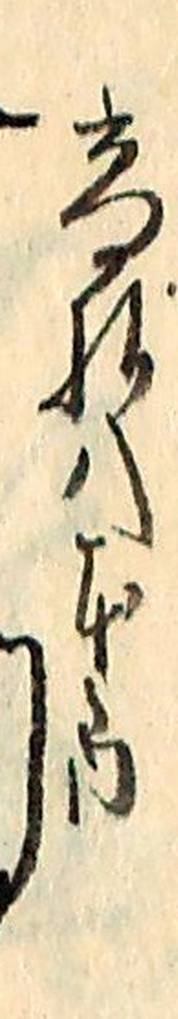高拾八本之内
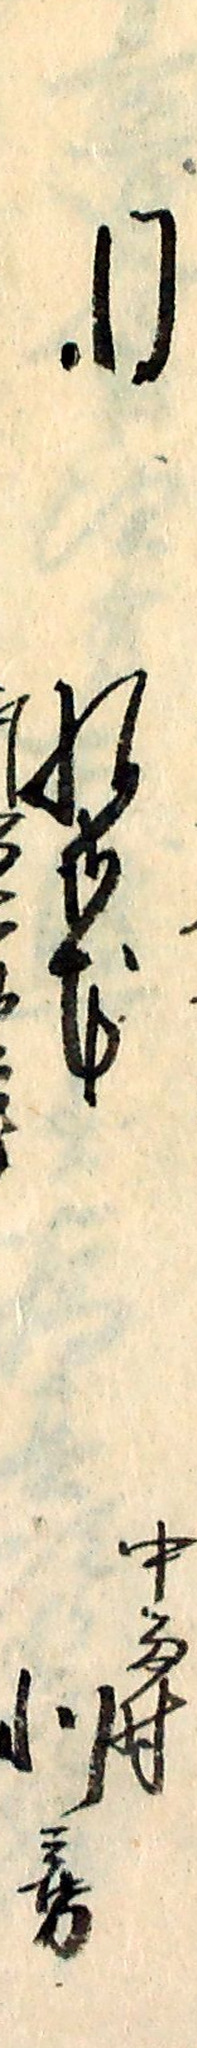一同拾弐本中た村
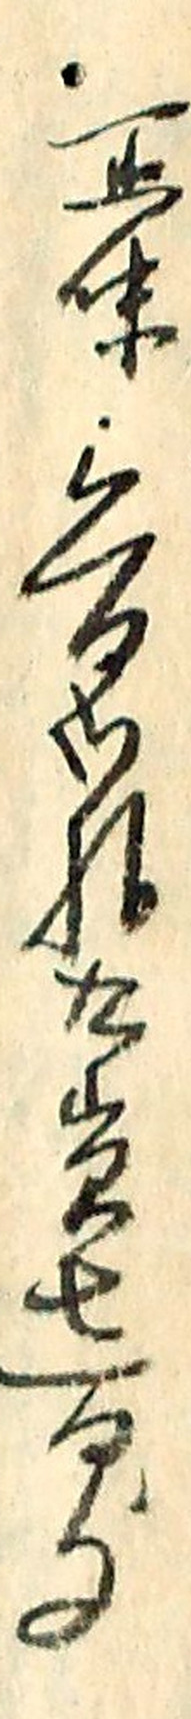正味三百弐拾九貫七百メ
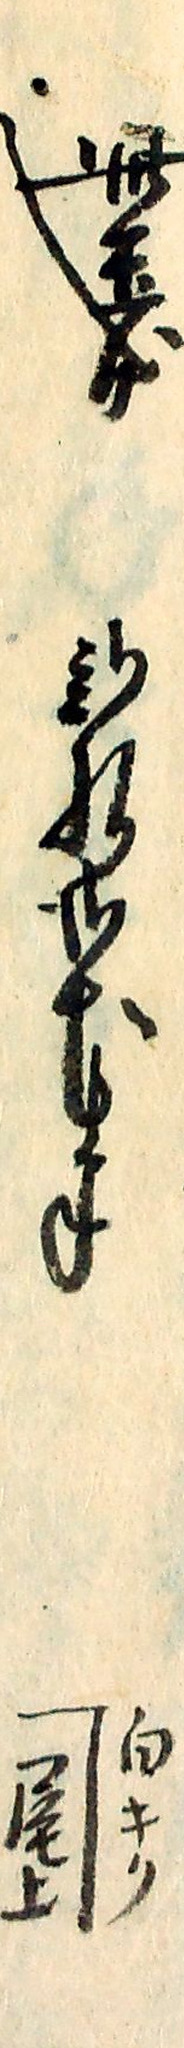此玉成弐拾弐本半白キク
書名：諸御願書控(後藤氏壱番）
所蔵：鳴門教育大学 Naruto University of Education
